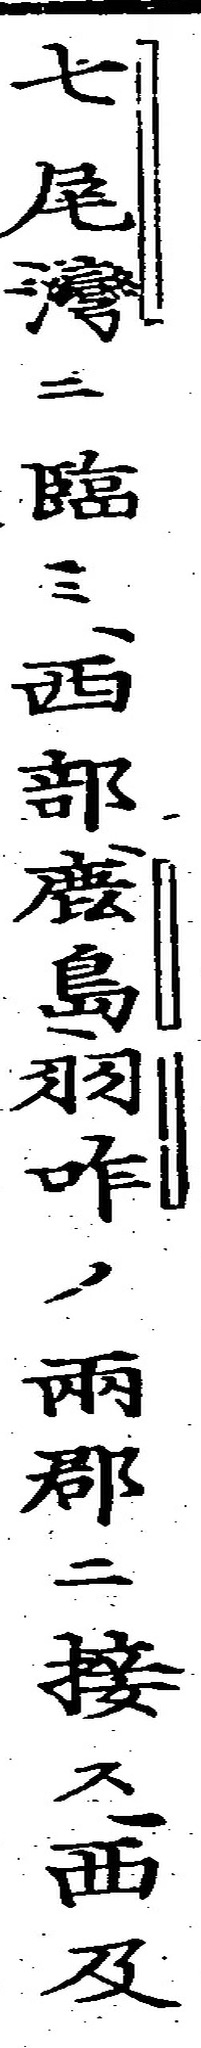七尾湾ニ臨ミ、西部、鹿島・羽咋ノ両郡ニ接ス、西及
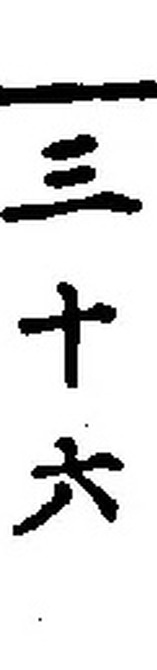三十六
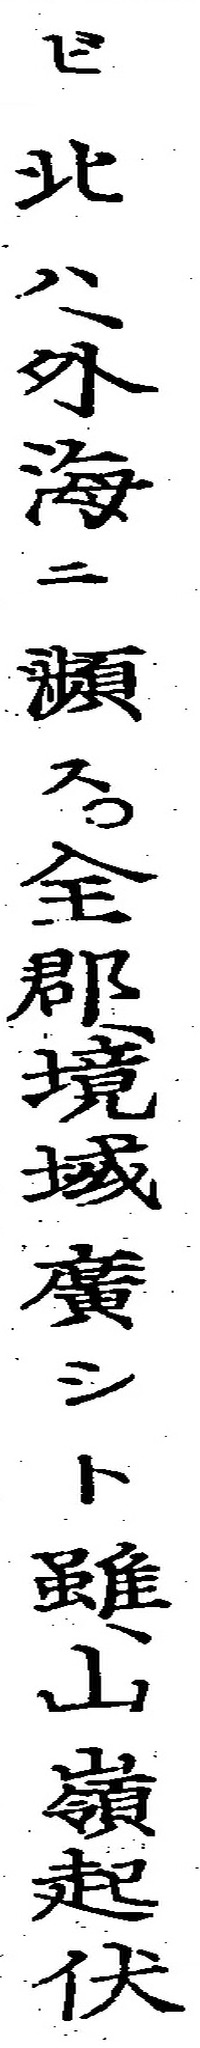ビ北ハ、外海ニ瀕ス。全郡、境域広シト雖、山嶺起伏
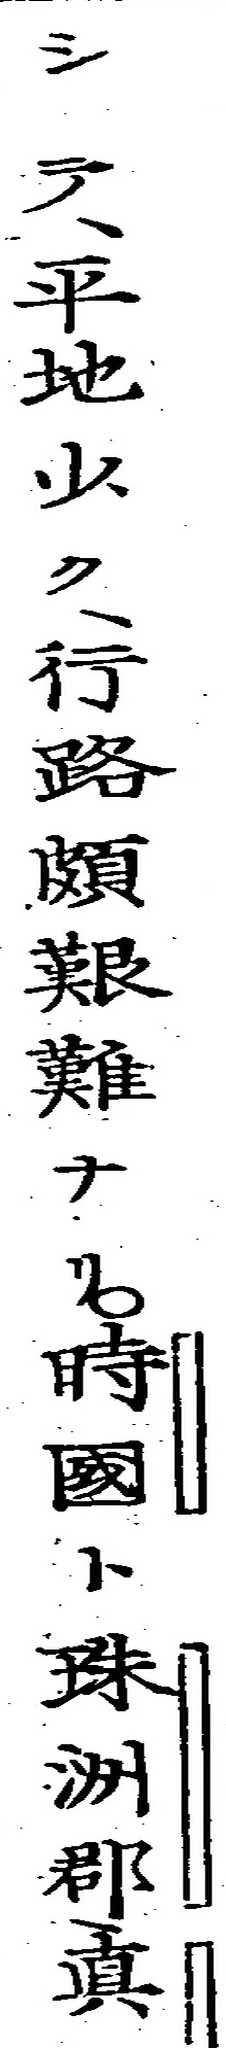シテ、平地少ク、行路頗艱難ナリ。時国ト珠洲郡・真
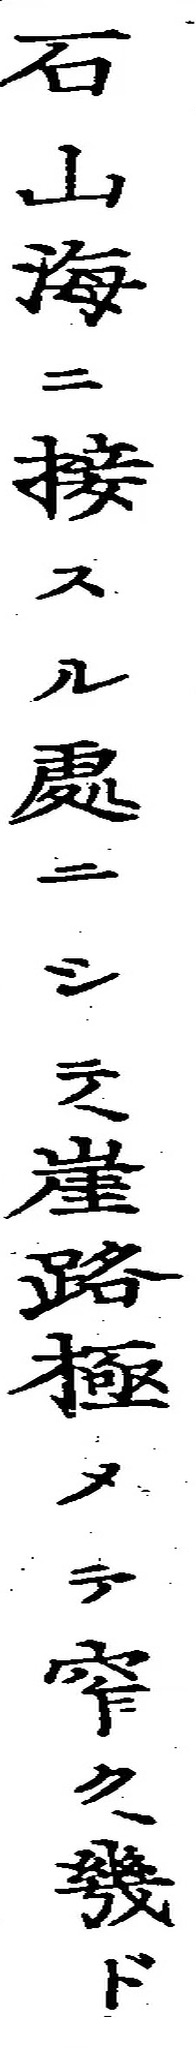石山海ニ接スル処ニシテ、崖路極メテ窄ク、幾ド

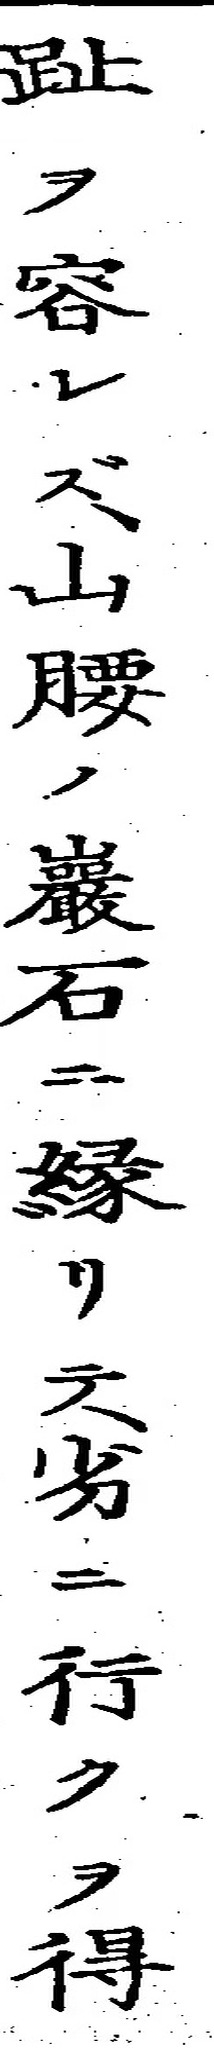趾ヲ容レズ、山腰ノ巌石ニ縁リテ、劣ニ行クヲ得
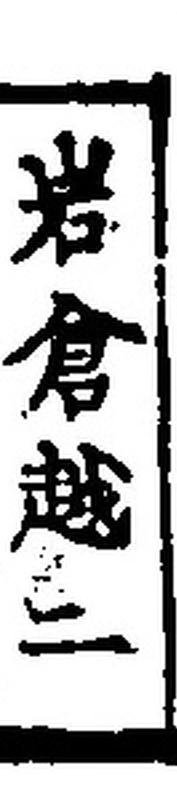岩倉越二
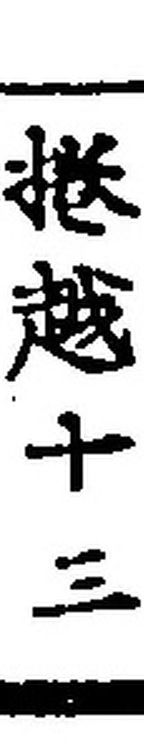捲越十三
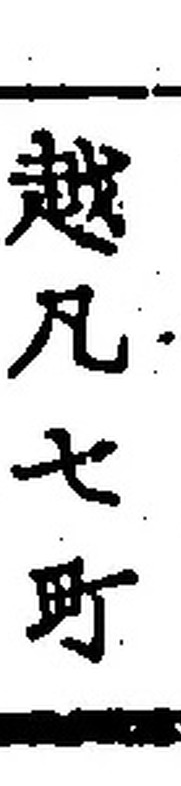越凡七町
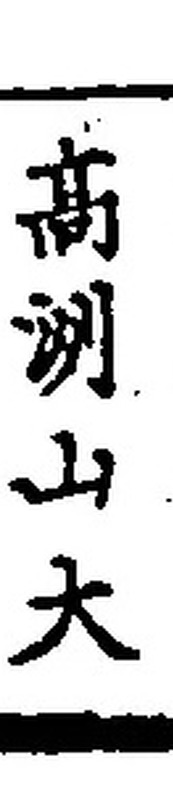高洲山大
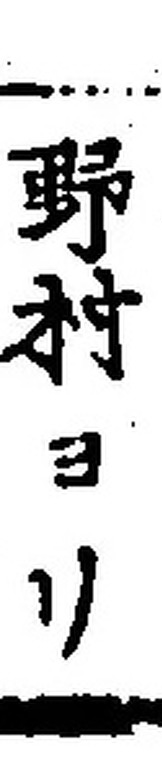野村ヨリ
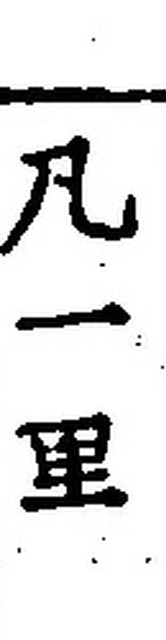凡一里
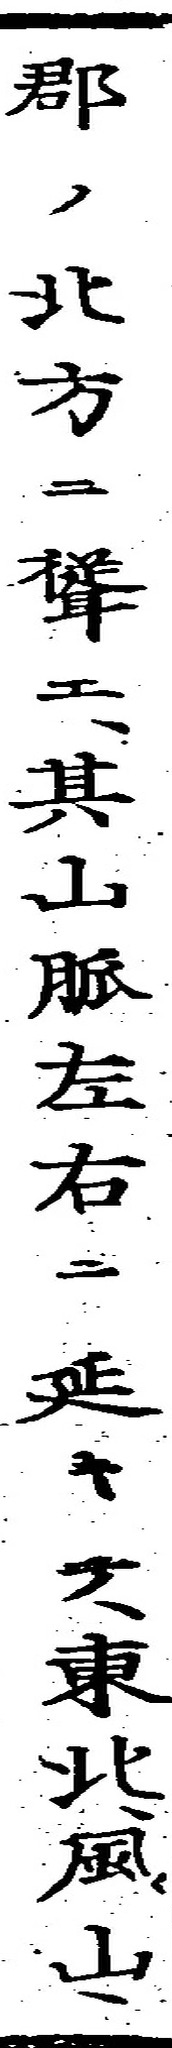郡ノ北方ニ聳エ、其山脈左右ニ延キテ、東北、風山・
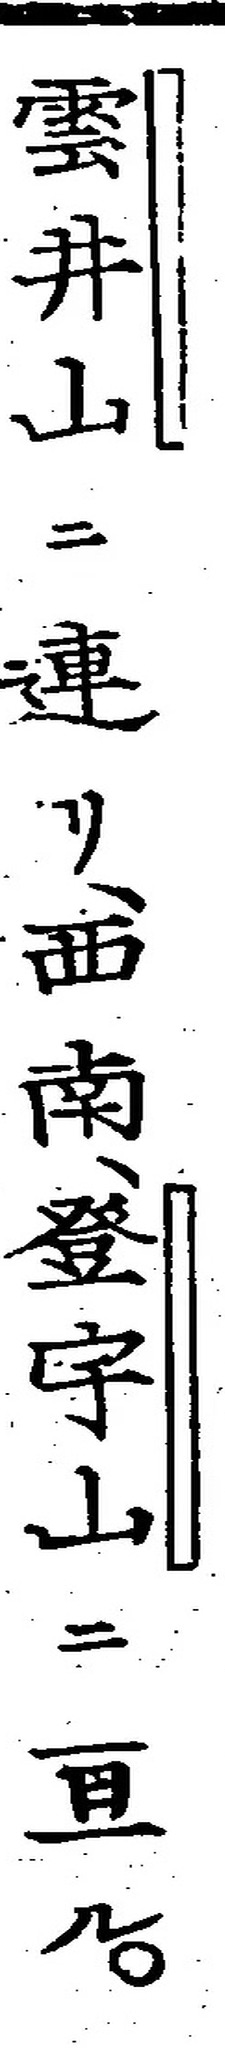雲井山ニ連リ、西南、登宇山ニ亘ル。
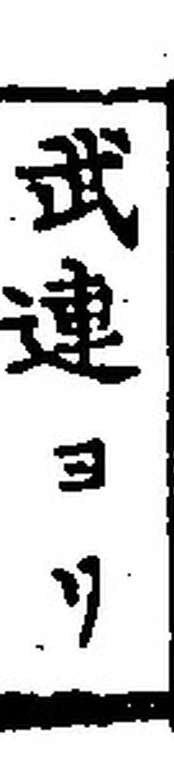武連ヨリ
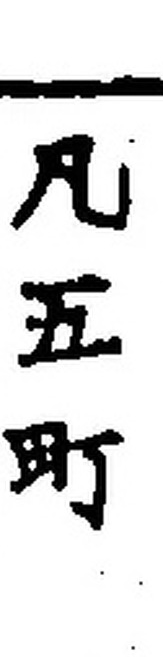凡五町
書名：能登地誌略
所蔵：国立国会図書館 National Diet Library, JAPAN
